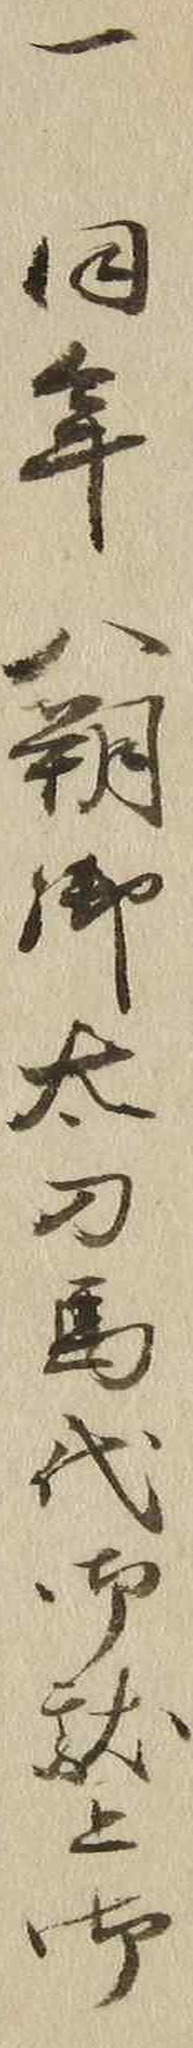一同年八朔御太刀馬代御献上御
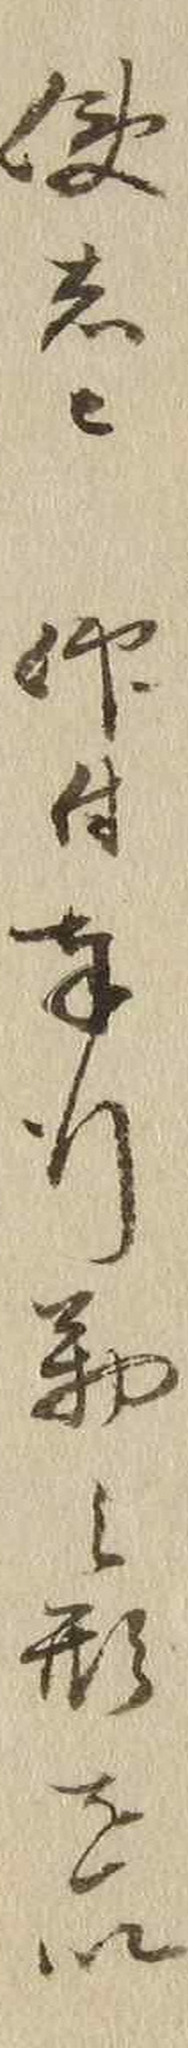使者被仰付奉行勤之形を以
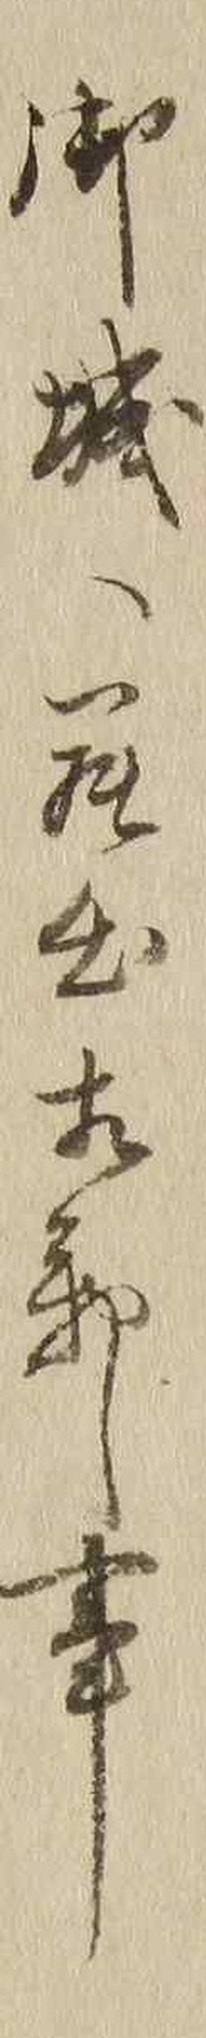御城へ罷出相勤候事
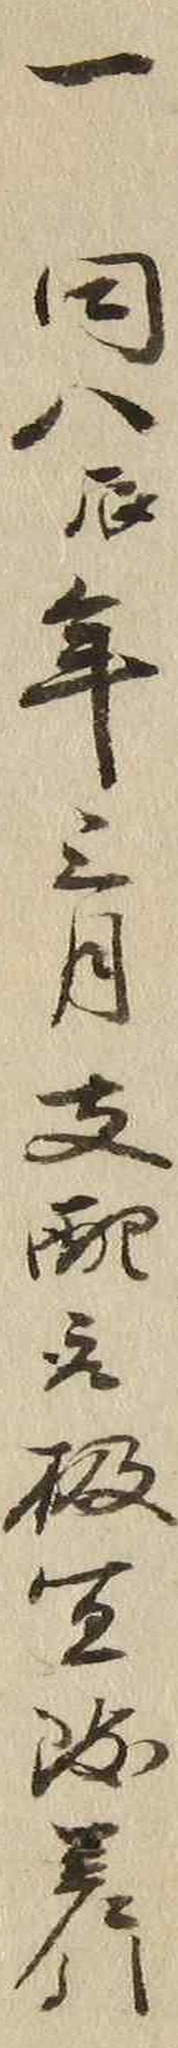一同八辰年三月支配取扱宜致差引
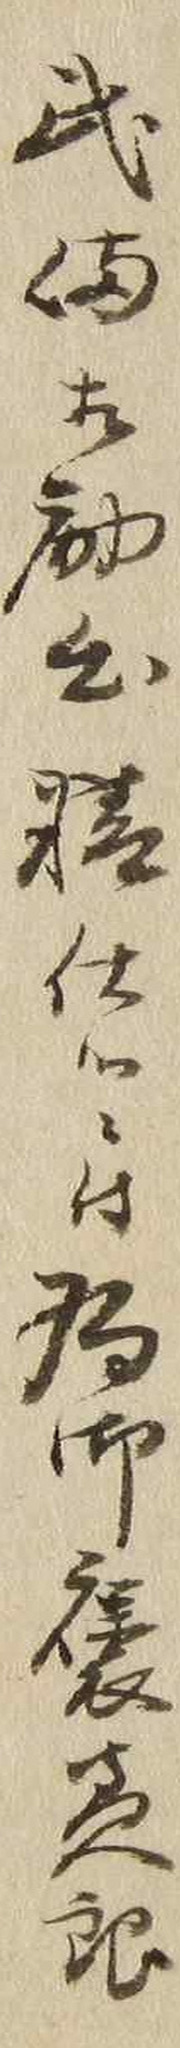武備相励出精仕候ニ付為御褒美銀
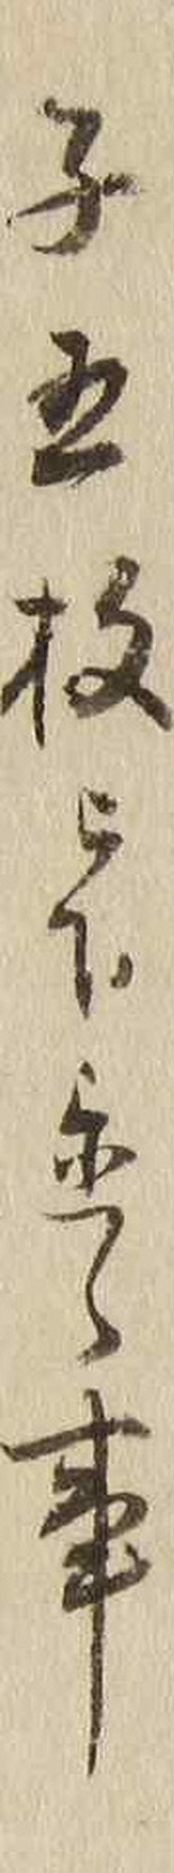子五枚被下置候事
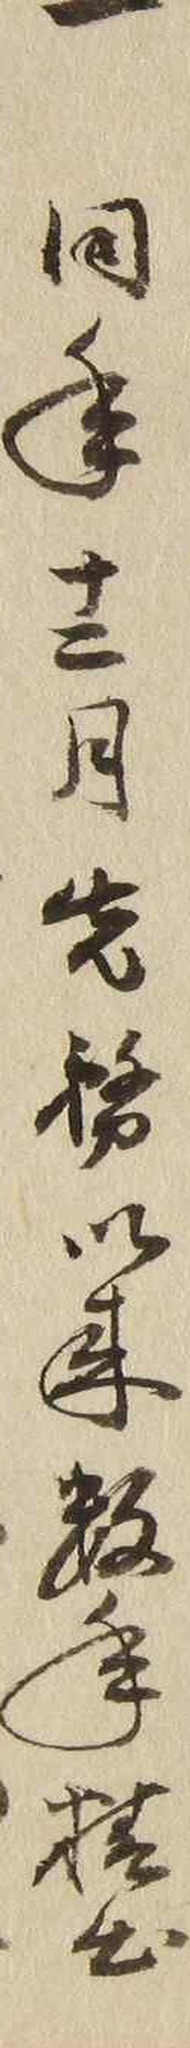一同年十二月先務以来数年精出
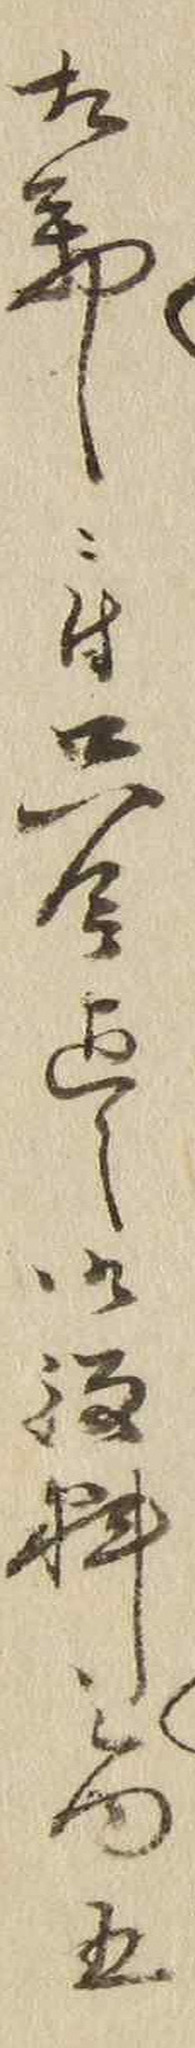相勤候ニ付只今迄之御役料之内五
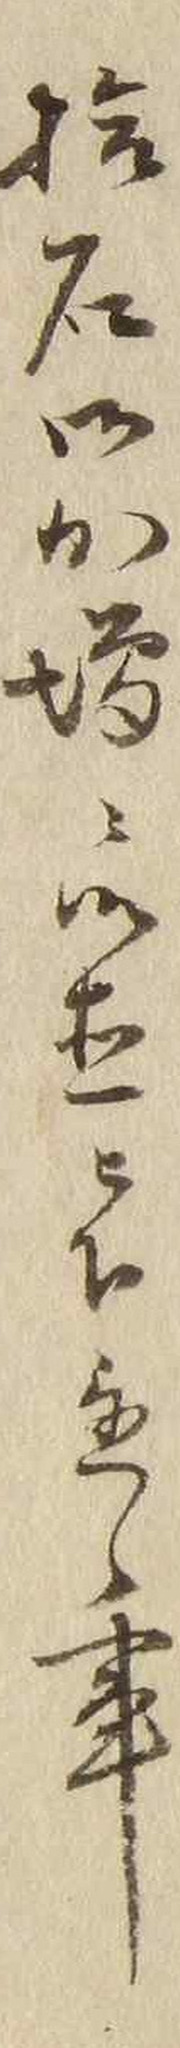拾石御加増ニ御直被下置候事

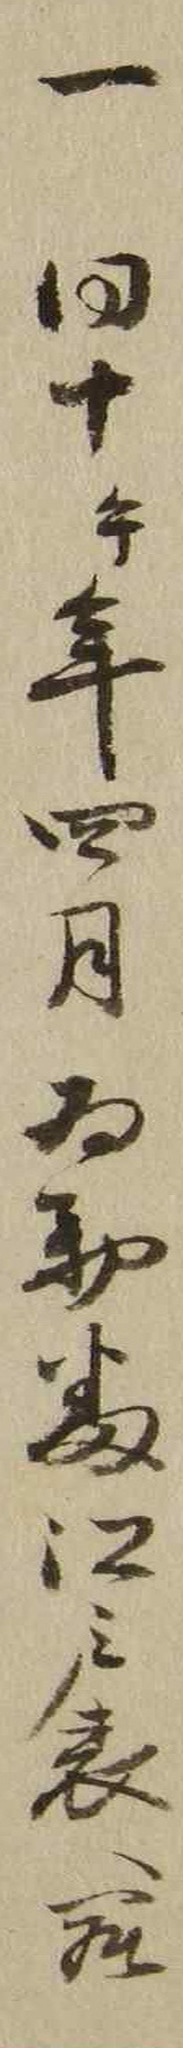一同十午年四月為勤番江戸表へ罷
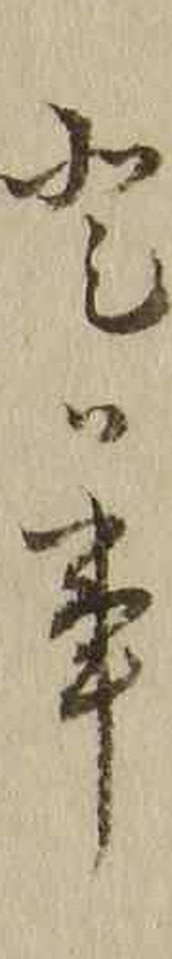登候事
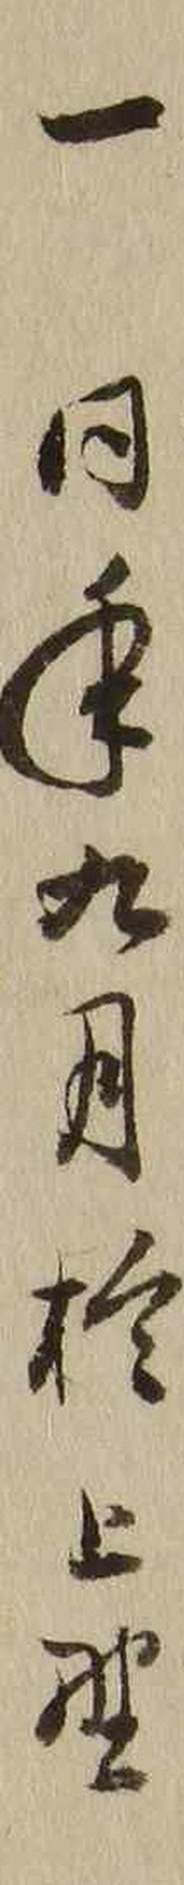一同年九月於上野
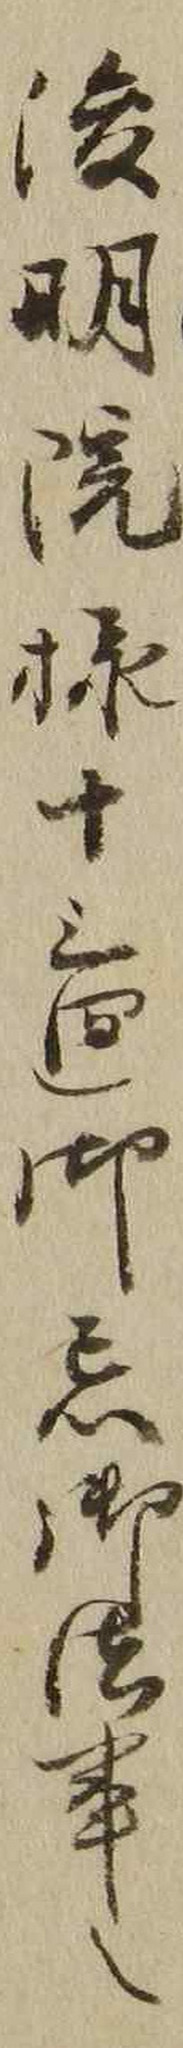俊明院様十三廻御忌御法事之
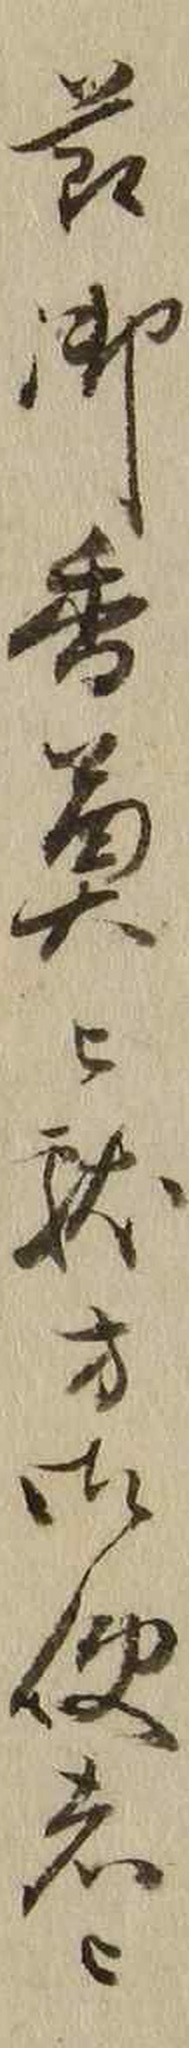節御香奠被献方御便者被
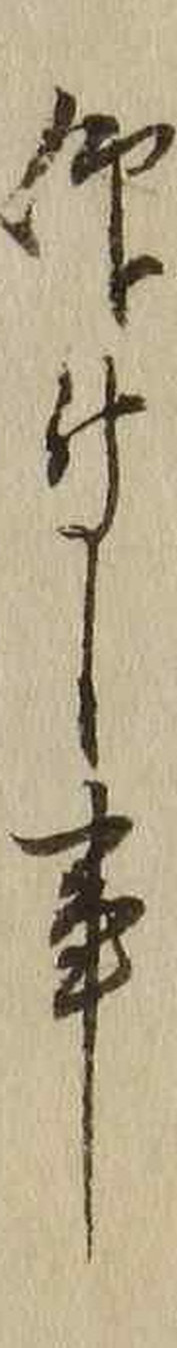仰付候事
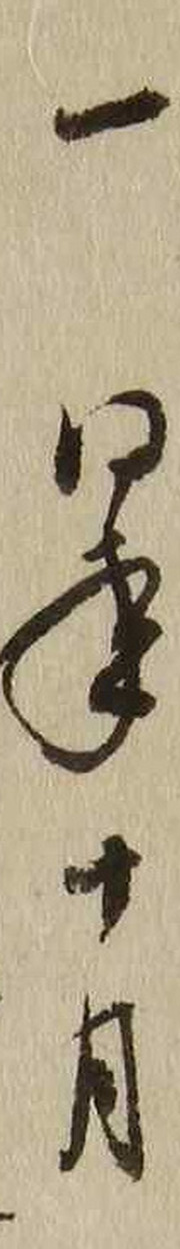一同年十月
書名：諸士系譜　巻之225　ま之部6
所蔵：会津若松市立会津図書館
